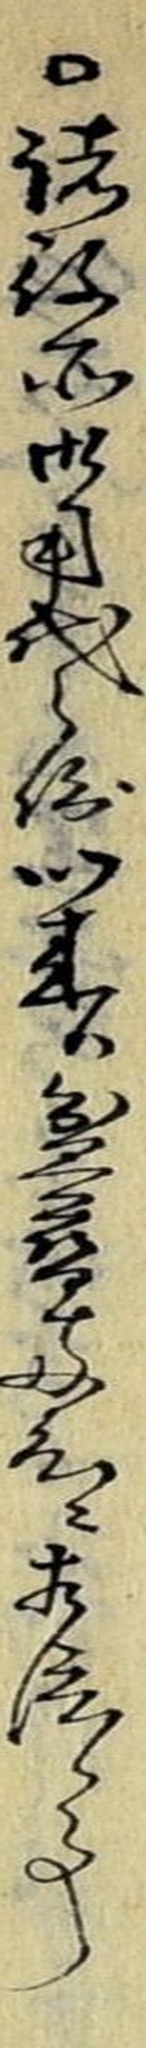○諸役所御用代之儀以来は盆暮両度に相渡候事
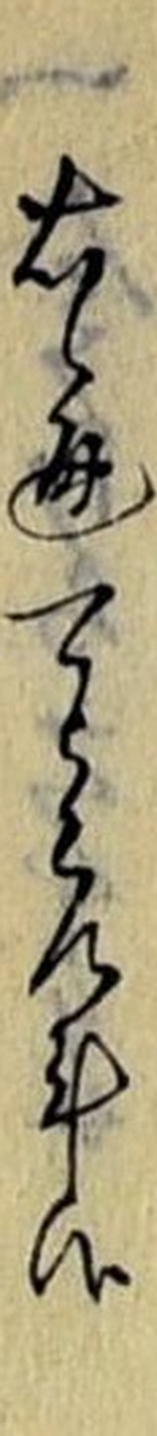右之通可被取斗候
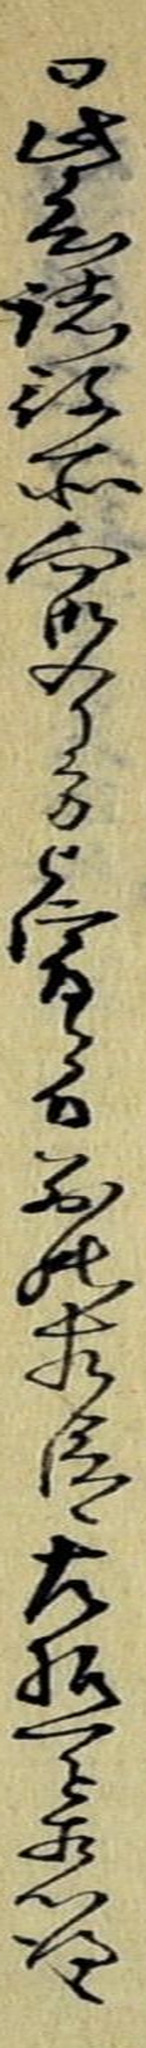○此度諸役所向御〆り方被仰付候に付別紙相渡候左様可被相心得候
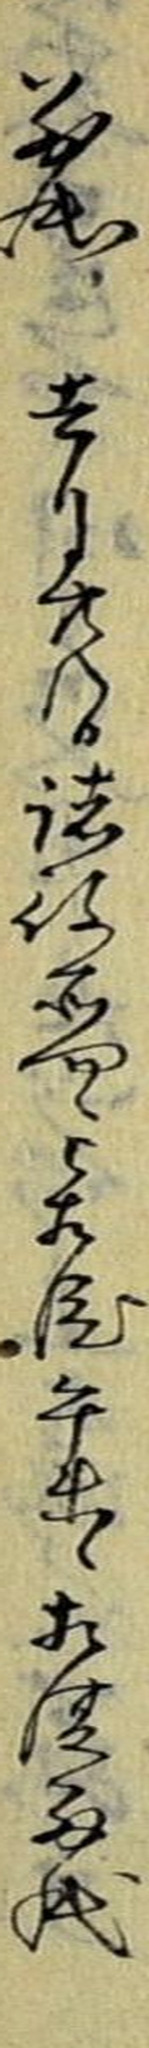別紙去月廿八日諸役所向へ被相渡午未之相復別紙
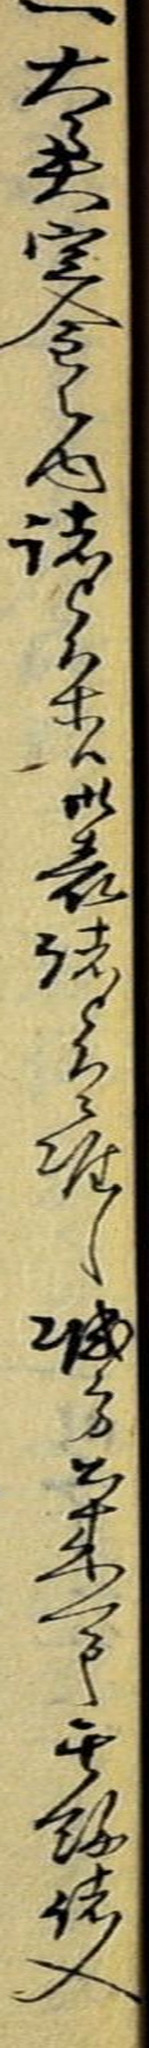一大奥定金之内諸被下等は御表詰被下に准し減方出来可申其餘諸入
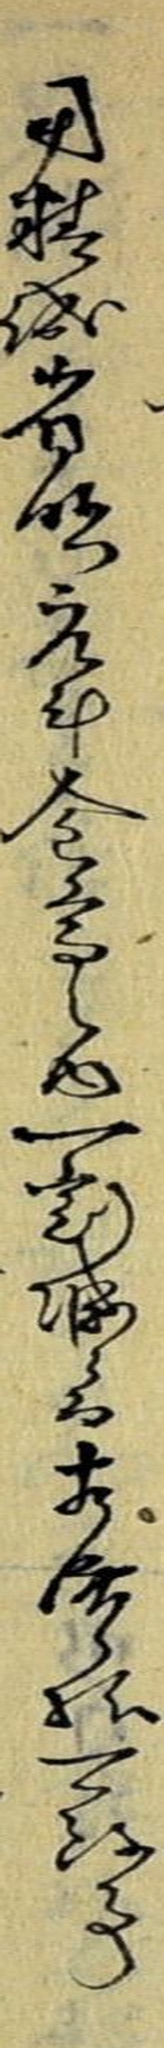用精誠省略取斗金高之内一割減に而相済候様可致事
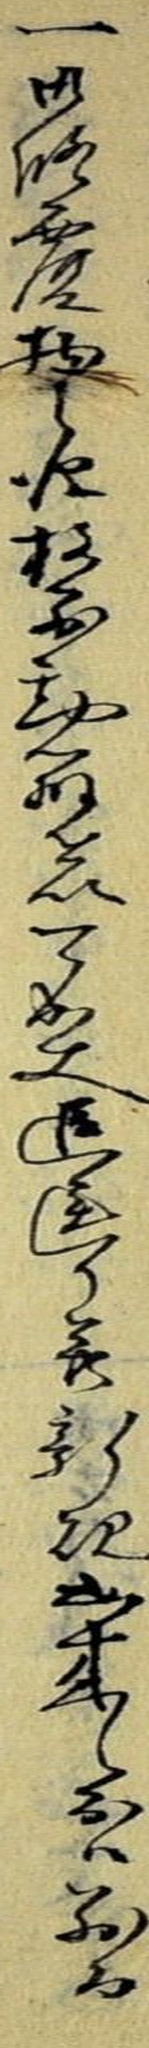一御修覆物之儀格別勘弁を以可成丈追送り并新規出来候分は別而
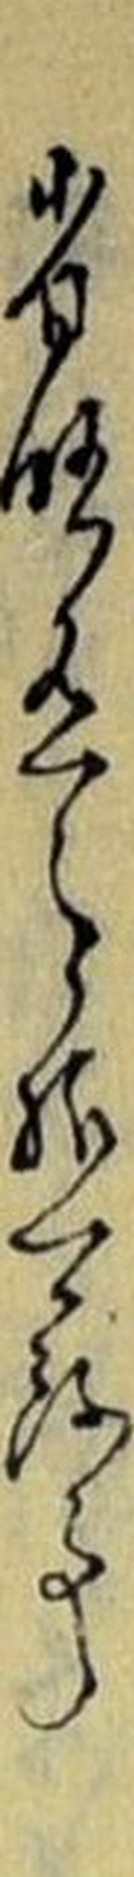省略有之候様可致事
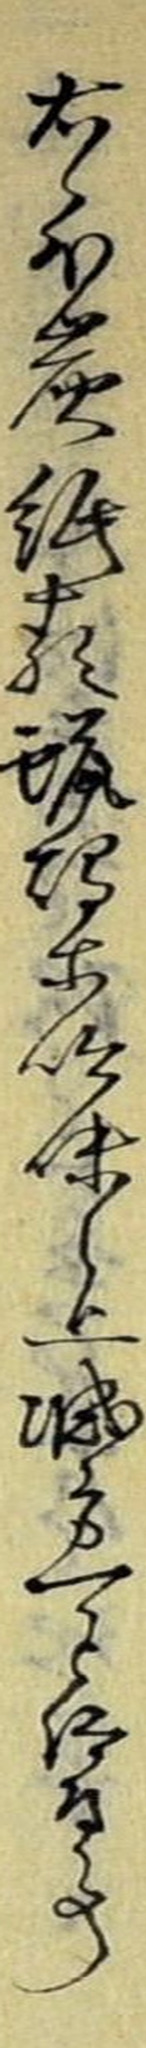右之外炭紙類蝋燭等吟味之上減方可被仰付事
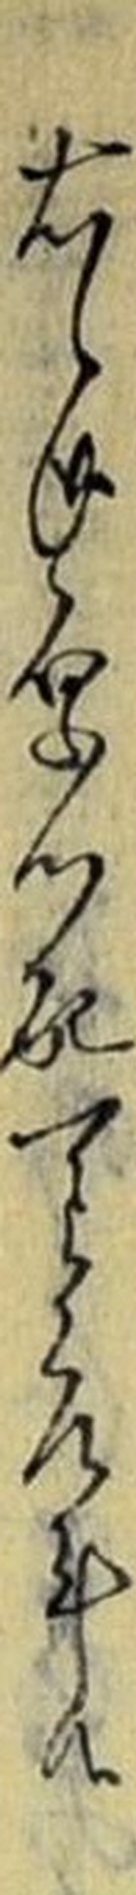右之趣厚心配可被取斗候
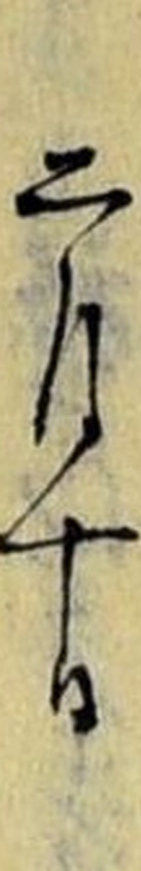二月十日
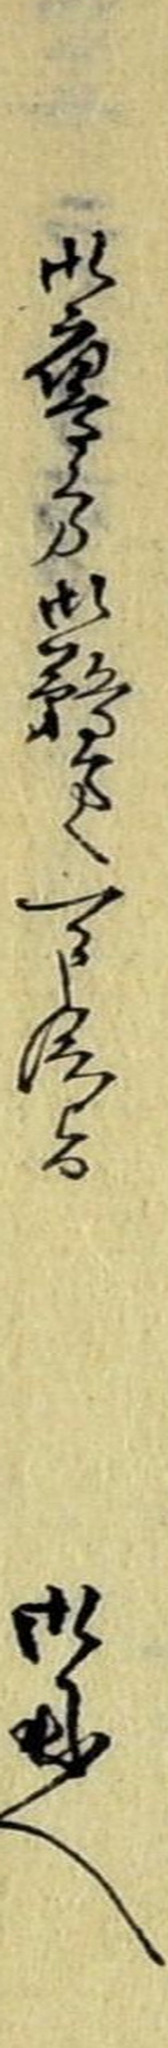御鷹方御鵜方へ可申渡旨御用人
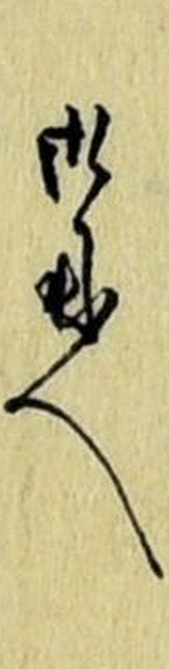御用人
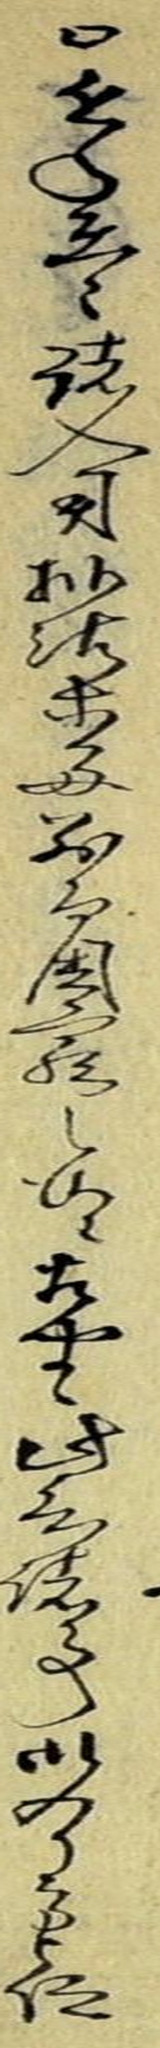○近年在々諸入用掛銀等多別而困窮之儀に相聞候此度諸事御〆り方被仰
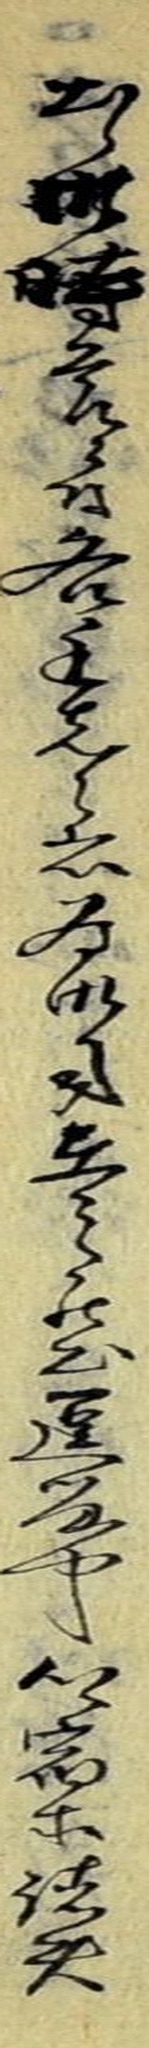出候御時節に付各手先之者為御用在々へ罷出逗留中郷宿等諸失
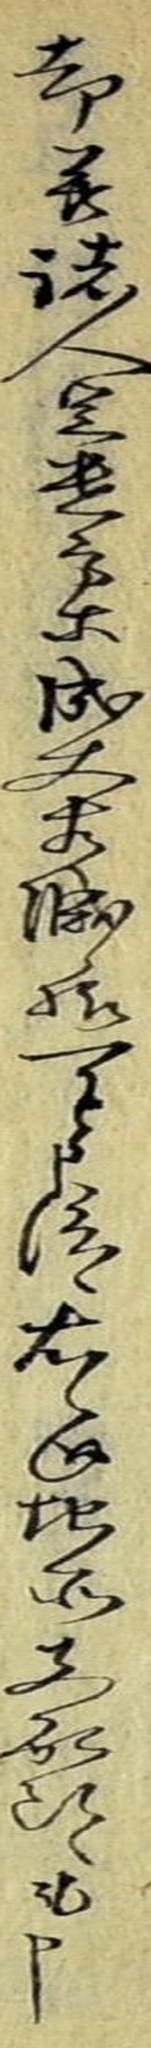却并諸人足方等成丈相減候様可被申渡候右之趣地所支配頭へも申
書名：命令之部 四
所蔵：福井県文書館 Fukui Prefectural Archives
